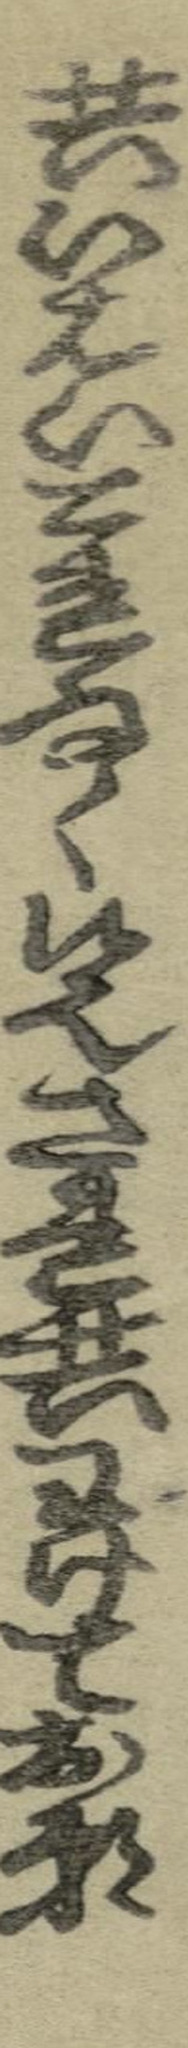共いはいこれなく候也され共わけてお願
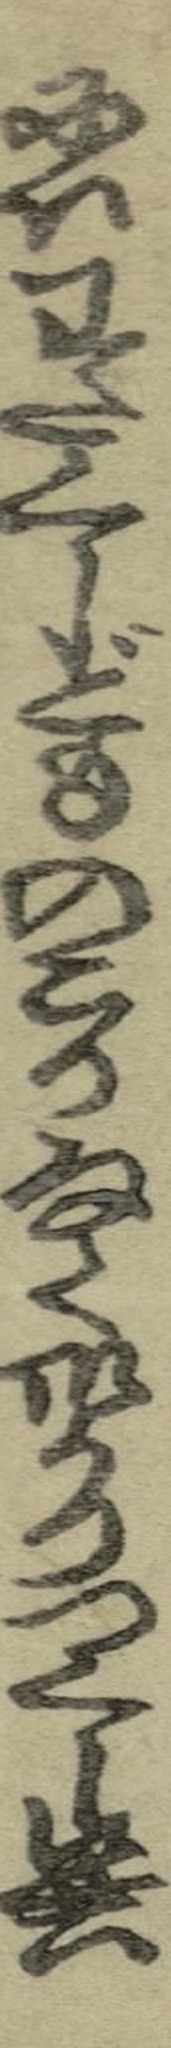にはわたくしどものこかなく御かりつくし候共
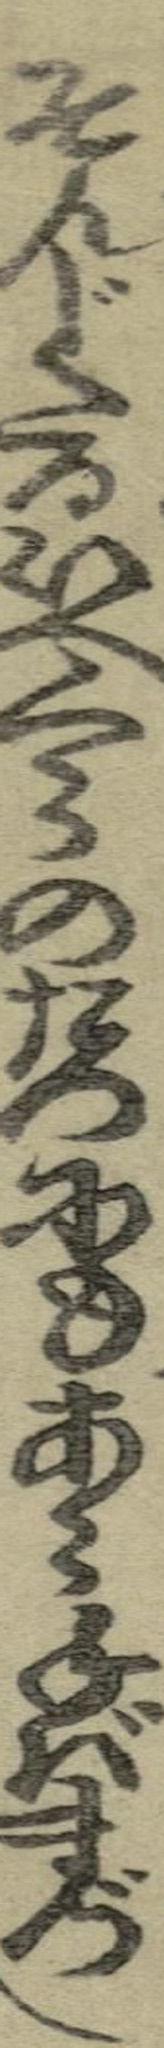そんじたるいへくらのたつにもあらねばまづ
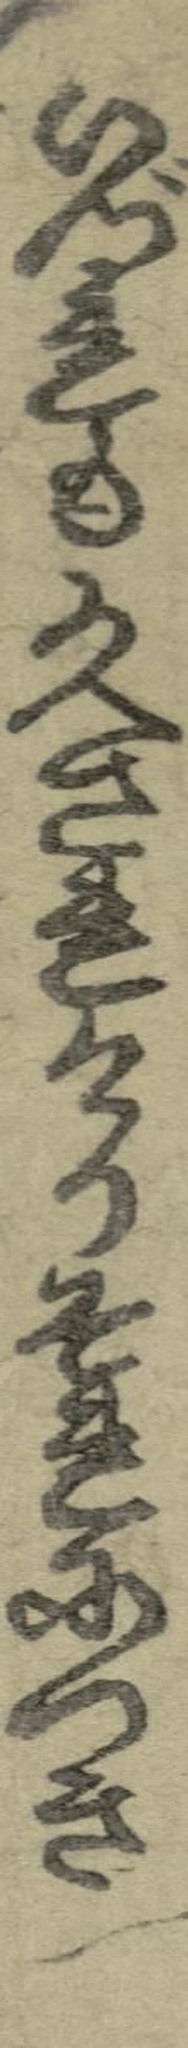いづれもかへされけりそれにつき
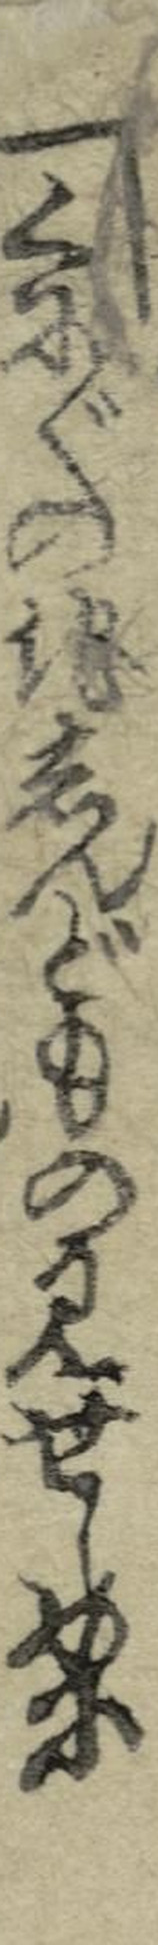〽くに〴〵の地しんどもの見せしめに
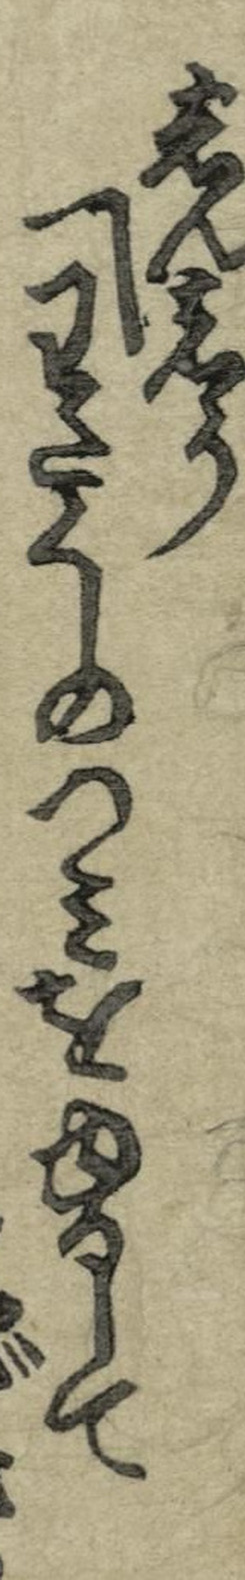〽わたくしのつみをゆるして
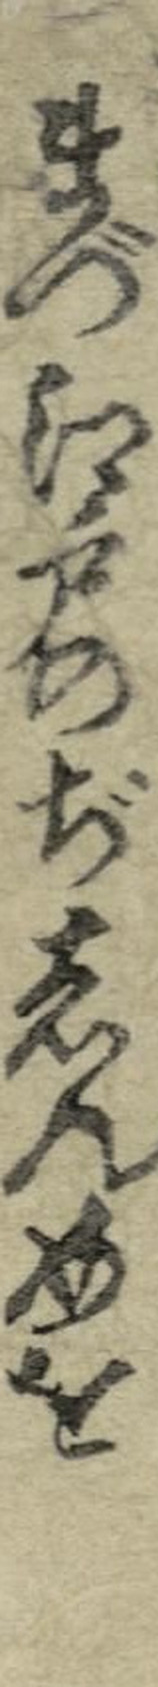まづ江戸のぢしんめを
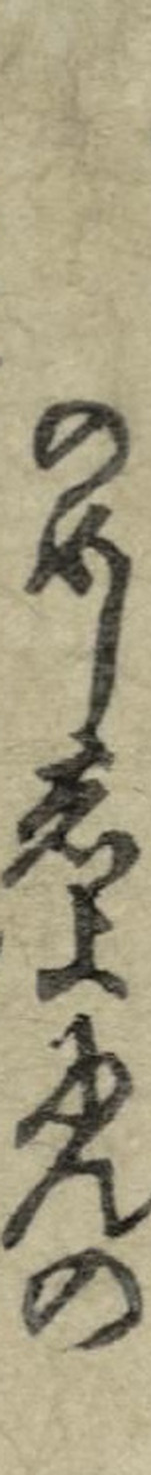のめししよにんの
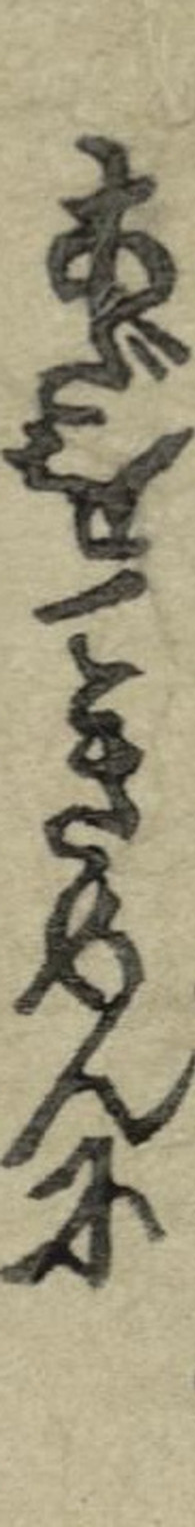あだをてきめんに
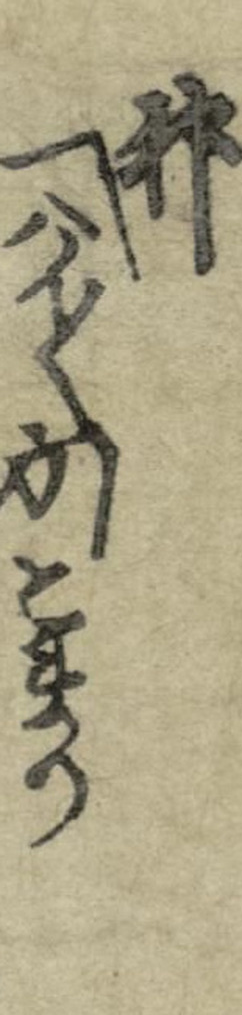〽ハイ〳〵かしこまり
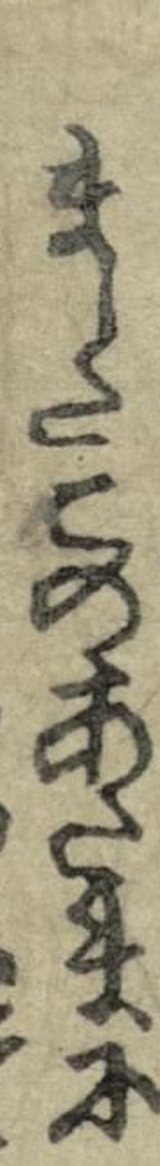ましたこのあたまに
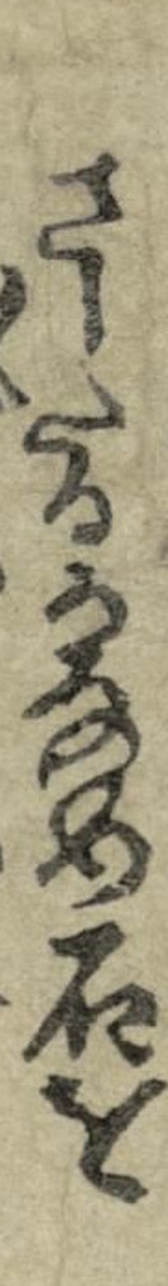さしたるかなめ石を
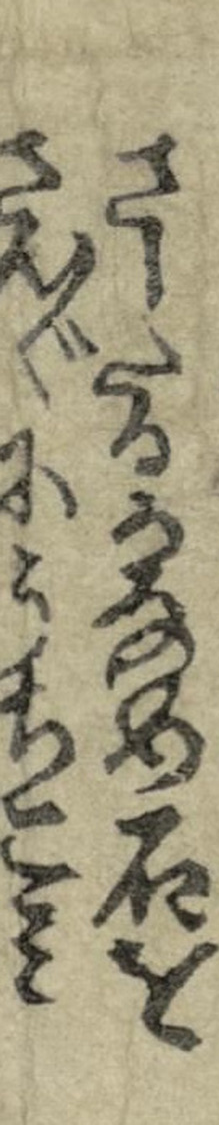さしたるかなめ石を
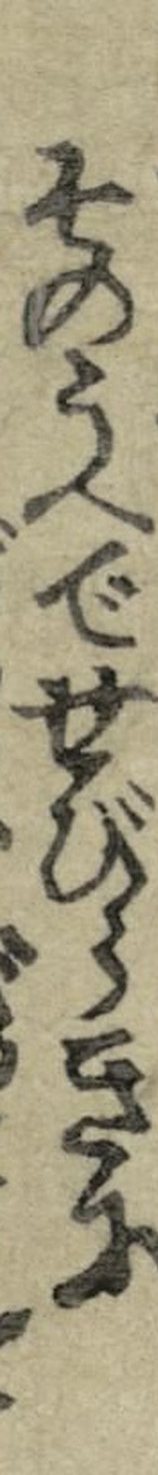そのうへでせびらきに
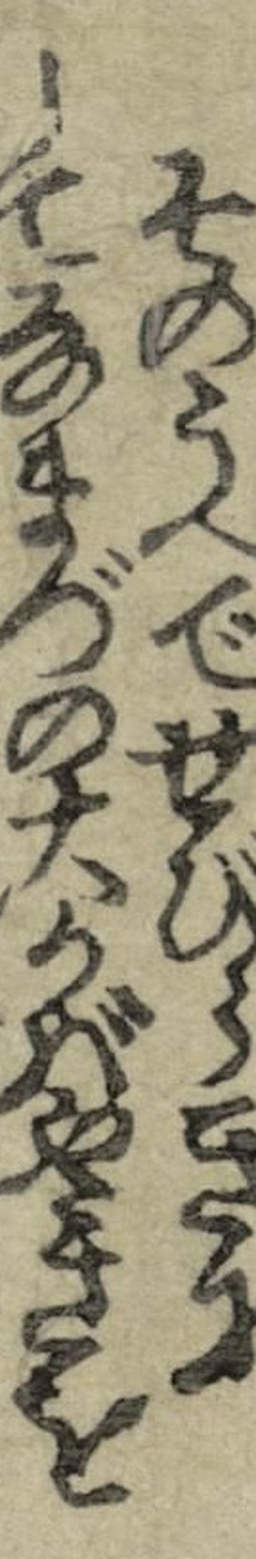してなまづの大かばやきを
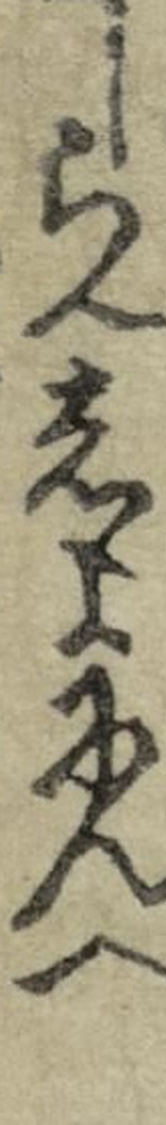こしらへしよにんへ
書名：自身除妙法
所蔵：東京大学地震研究所図書室 Earthquake Research Institute Library, The University of Tokyo, JAPAN
